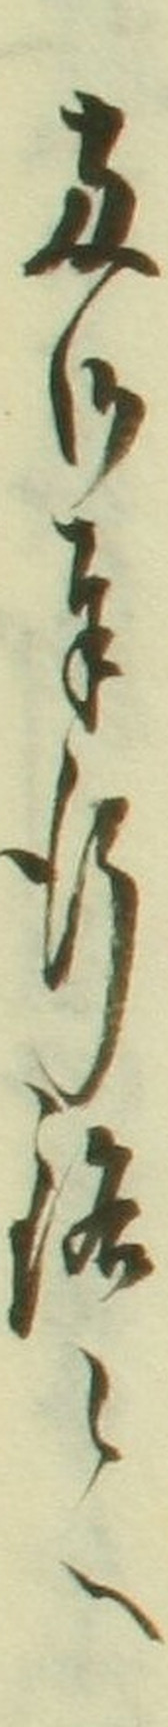両御奉行銘々へ

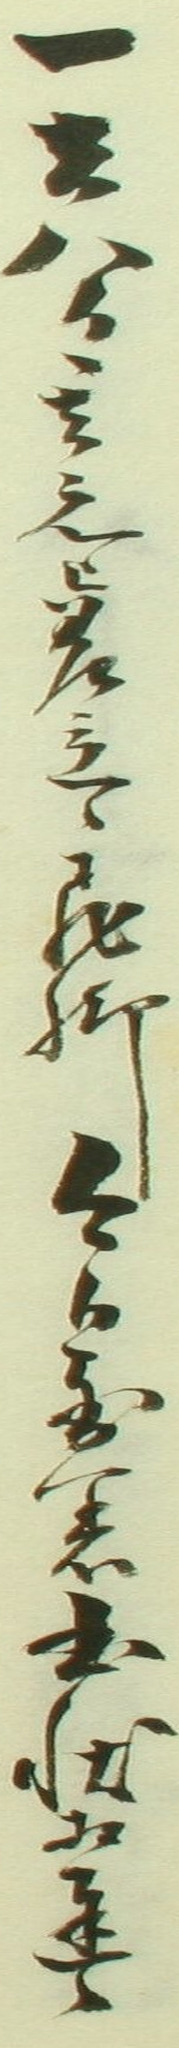一去八日其元被差立候飛脚今日到着書状相達候
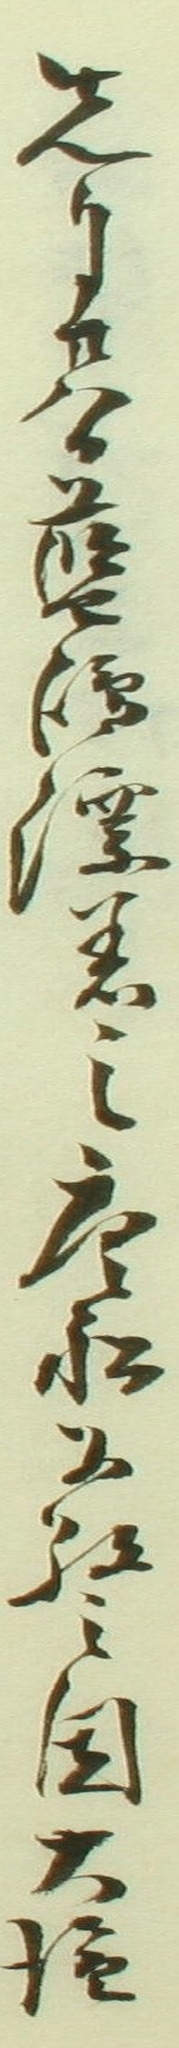先月廿八日藍嶋漂着之唐船為警固大塩
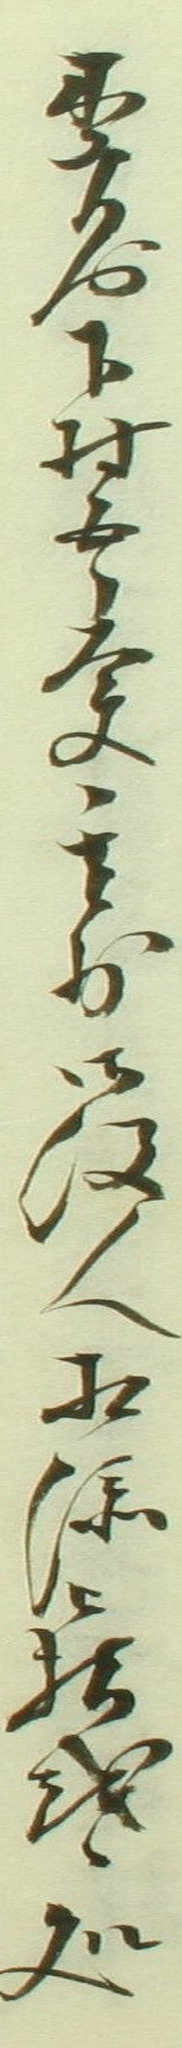杢左衛門下村五郎太夫其外御役人相添被指越候処
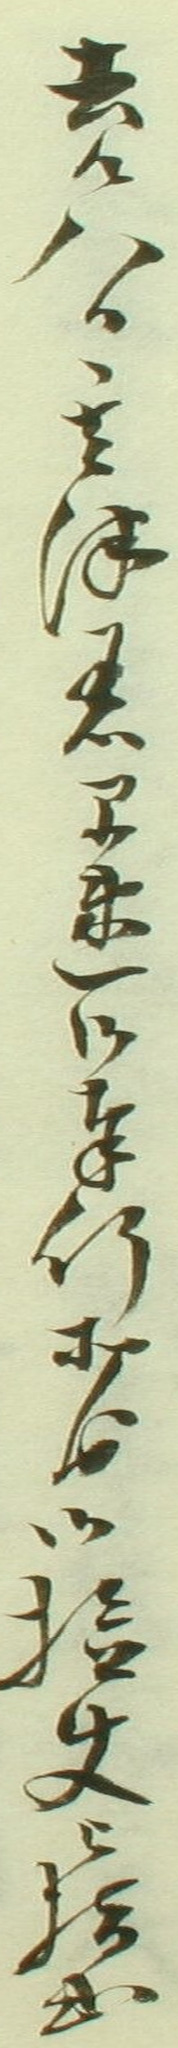去ル八日其津着早速御奉行所ゟ御検使被指出
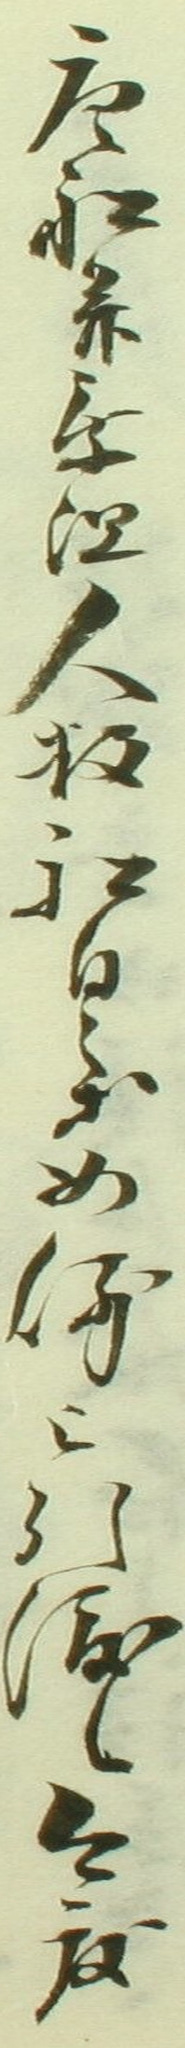唐船并乗組人数船具等如例被引渡候今度
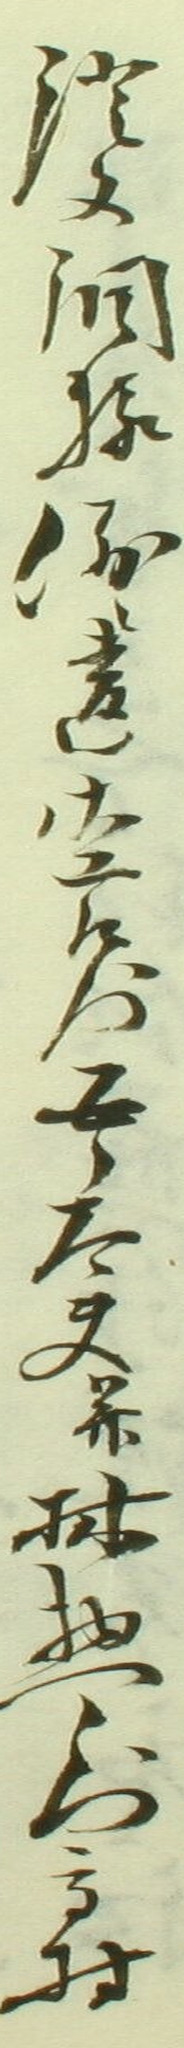証文調様例と違杢左衛門五郎太夫并林惣右衛門高村
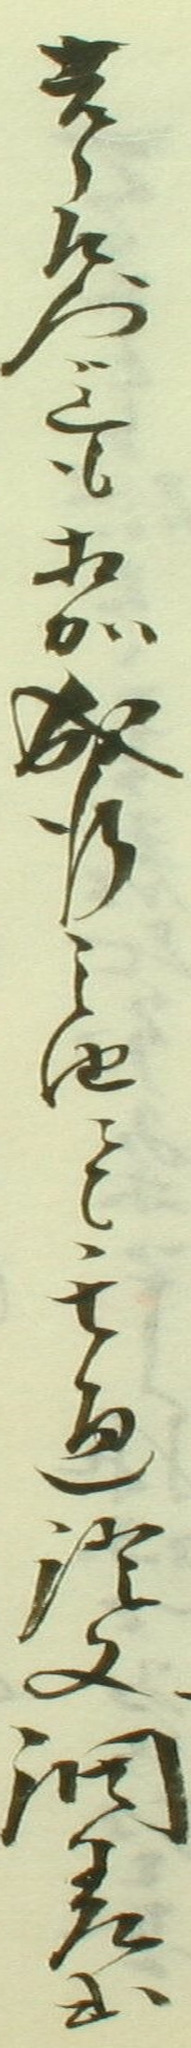吉郎左衛門迄も相加成行之由にて其通証文調差出
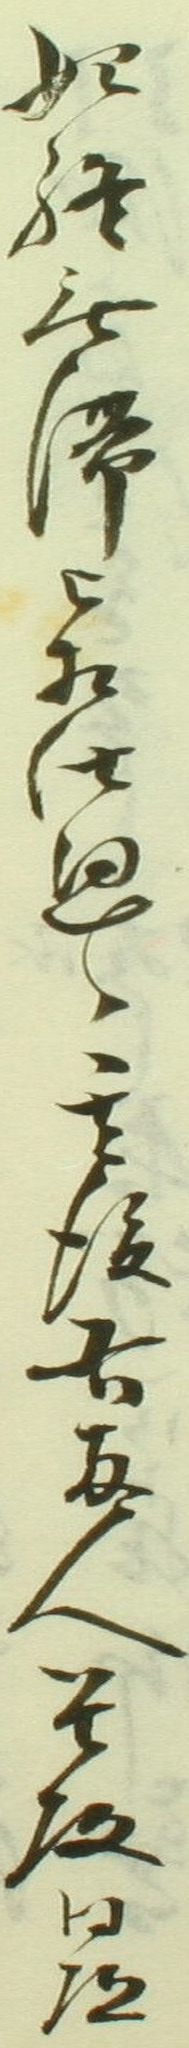始終無滞被相仕廻候其後右両人貴殿同道
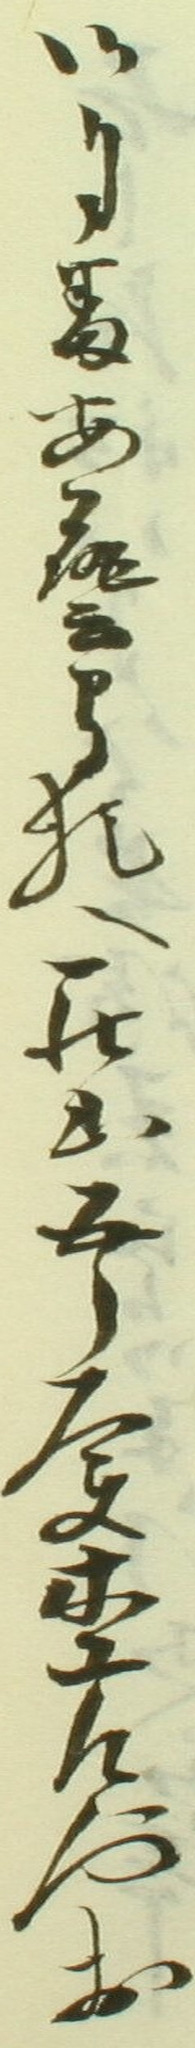御月番安芸守様へ罷出五郎太夫杢左衛門於
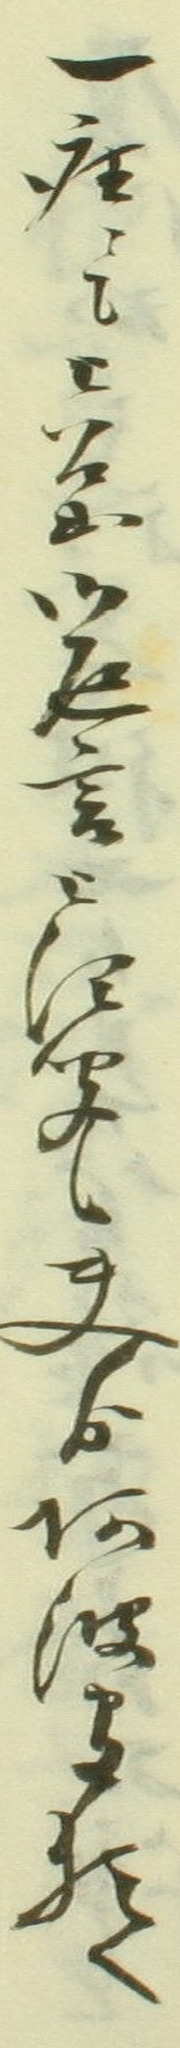一座ニて被召出御返言被仰聞候夫ゟ阿波守様へ
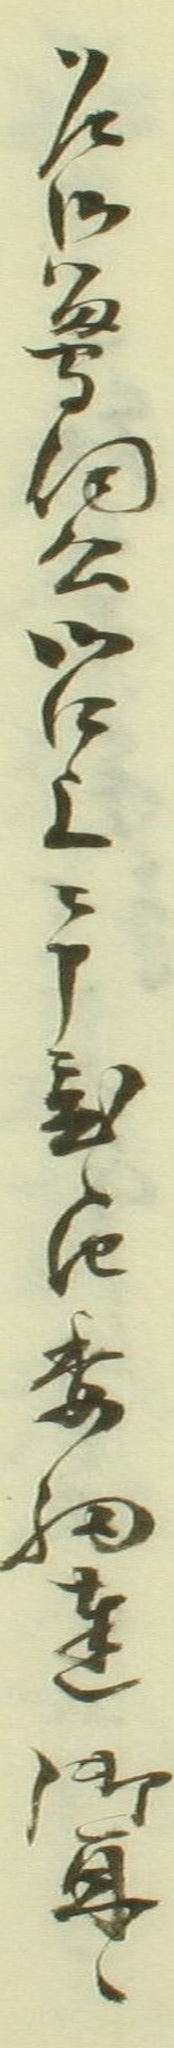乍御留守伺公御口上被申置候由委細達御耳候
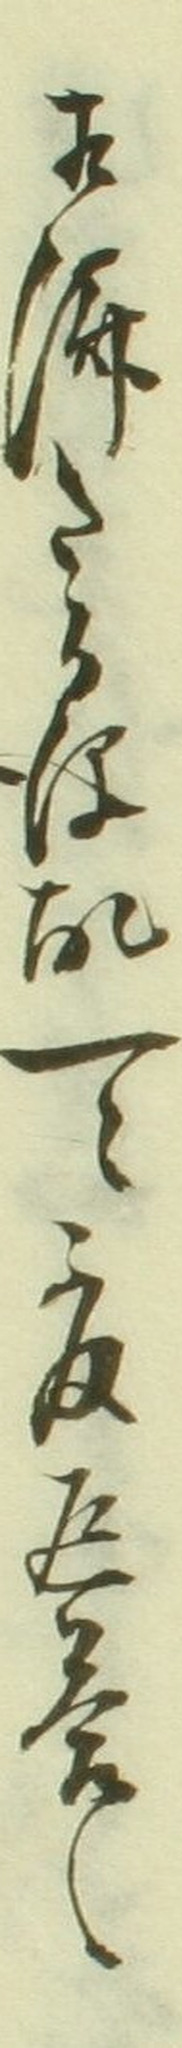相済たる儀故一々不及返答候
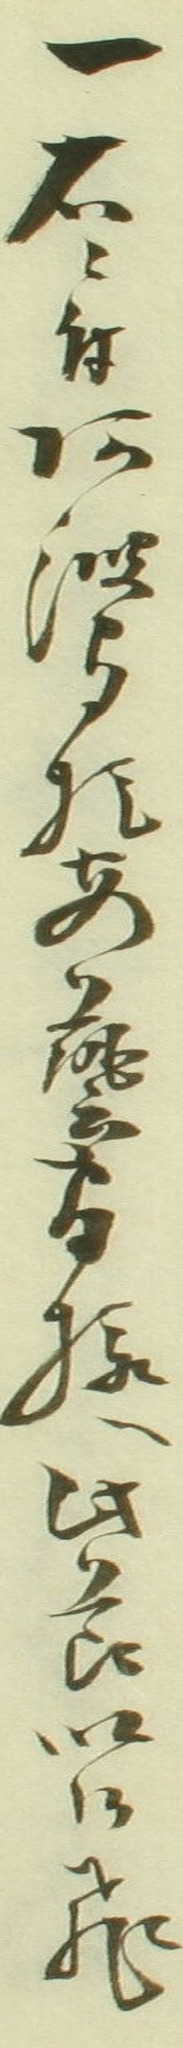一右ニ付阿波守様安芸守様へ此節以御飛
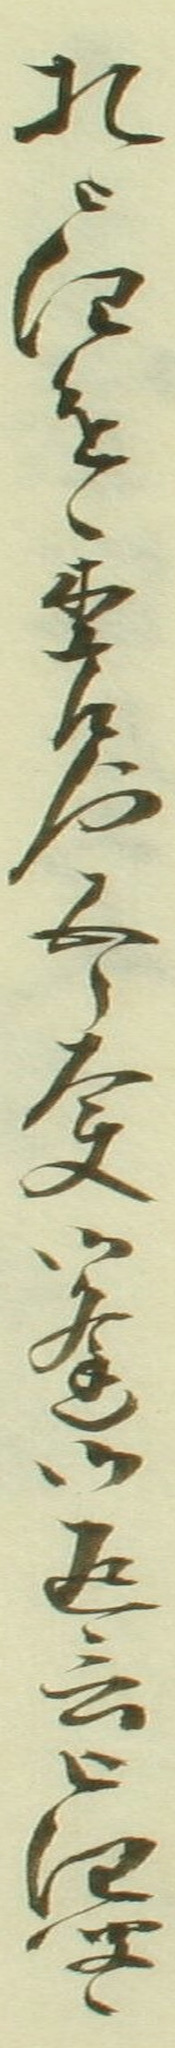札被仰進候杢左衛門五郎太夫御逢御返言被仰聞候
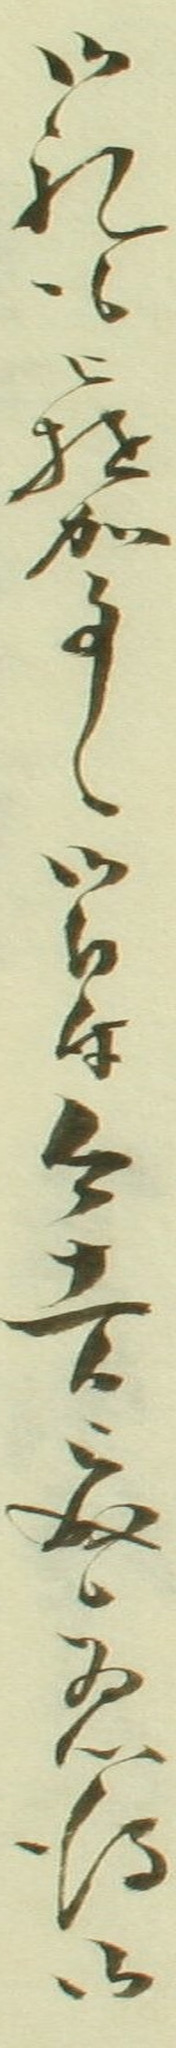御札も被遊加事御日付今十一日被成候為心得御
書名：異国船漂着記
